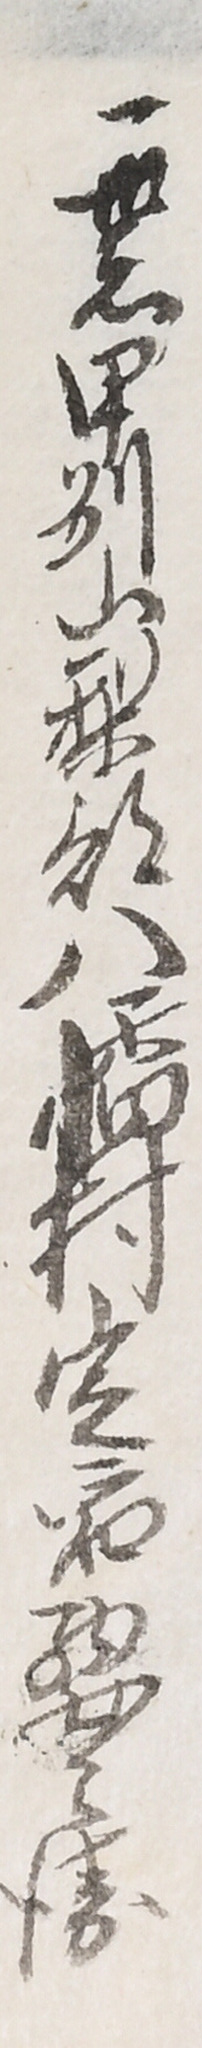此者甲州山梨郡八幡村定宿要兵衛
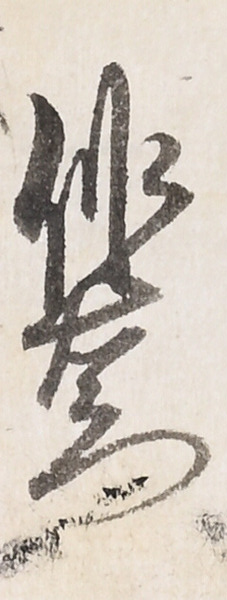作右衛門
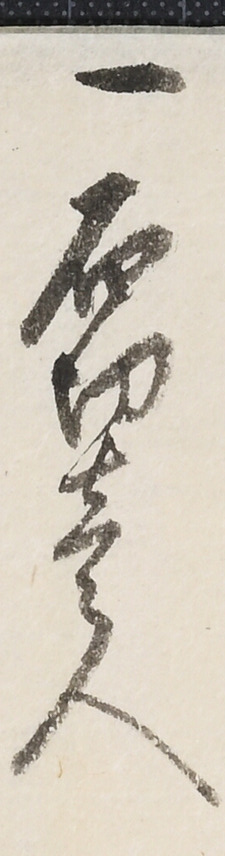一石切壱人
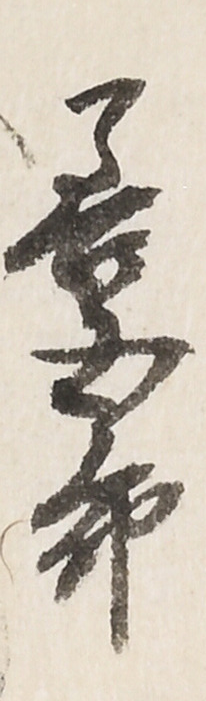善五郎
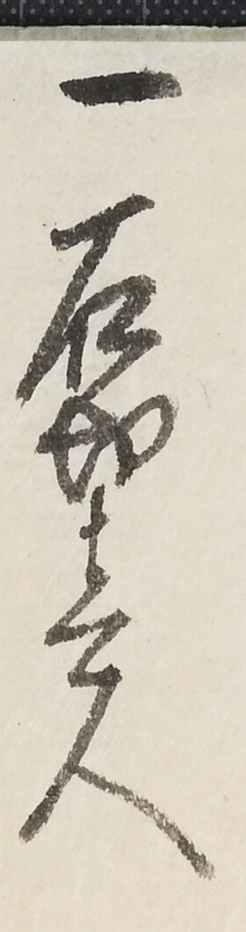一石切壱人
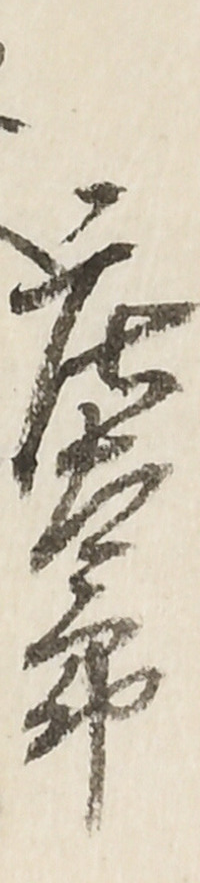庄太郎
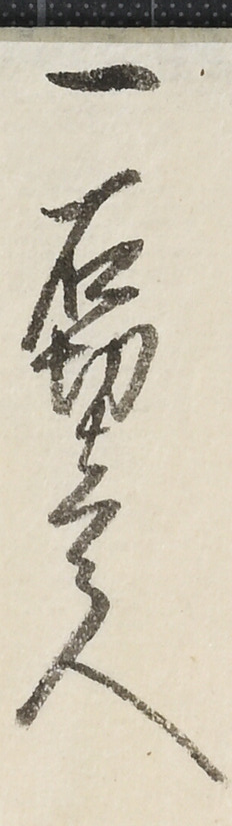一石切壱人
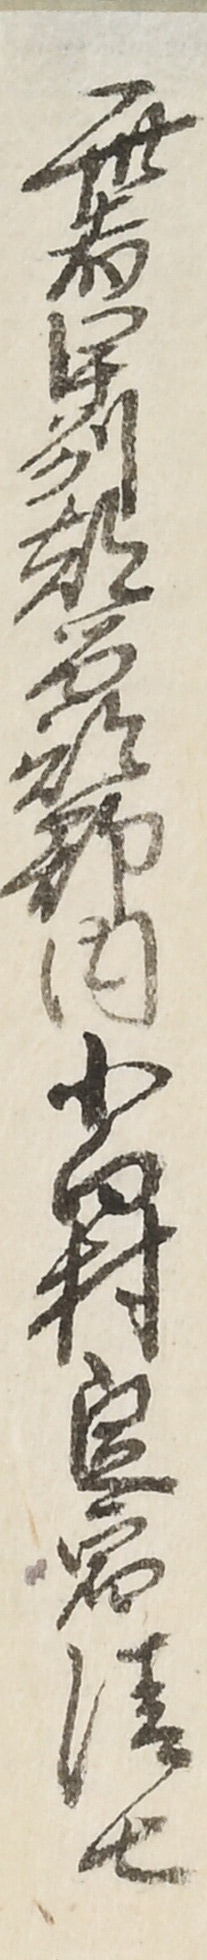此者甲州都留郡郡内小向村定宿清七
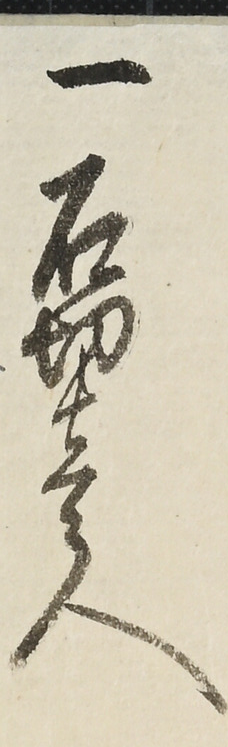一石切壱人
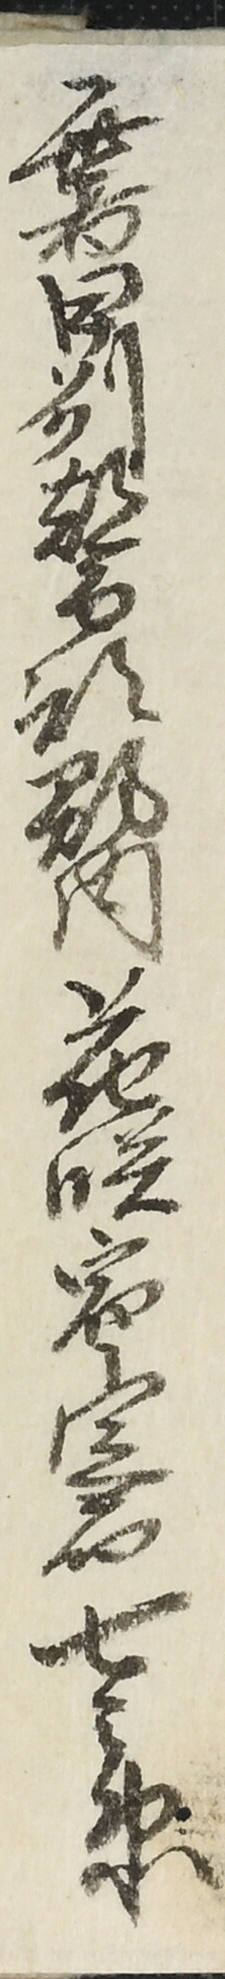此者甲州都留郡郡内下花咲宿定宿七兵衛
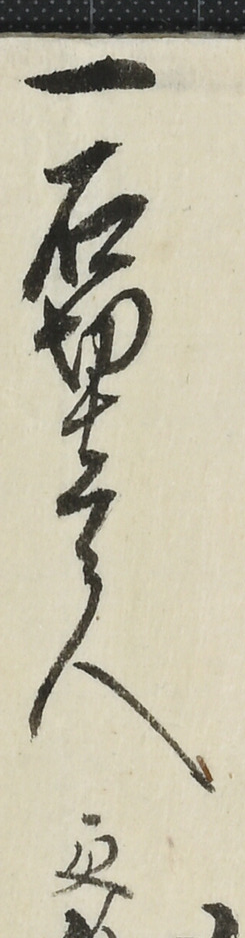一石切壱人
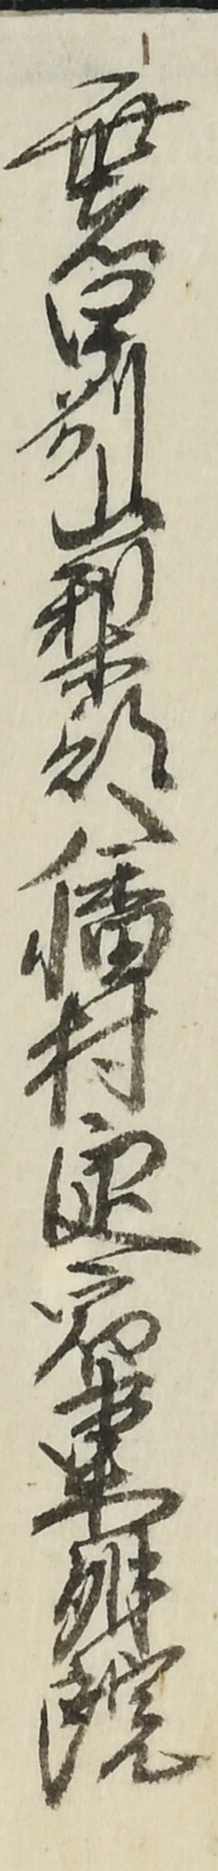此者甲州山梨郡八幡村定宿要兵衛
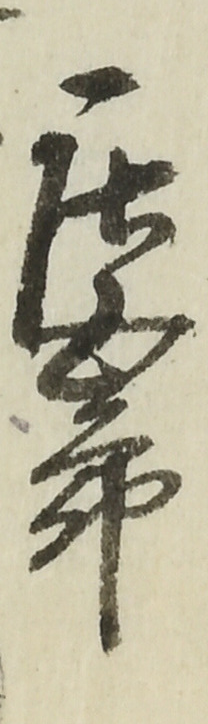善五郎
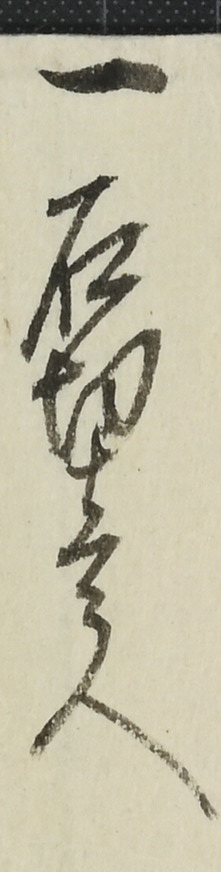一石切壱人

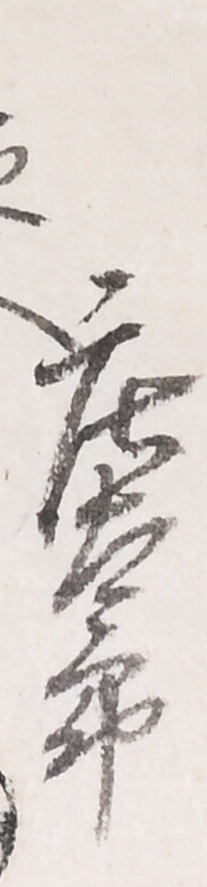庄五郎
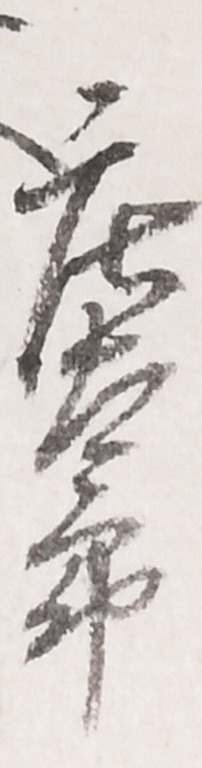庄五郎
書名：安政六己未年二月石切名前書上帳
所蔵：伊那市立高遠町図書館・合同会社AMANE
